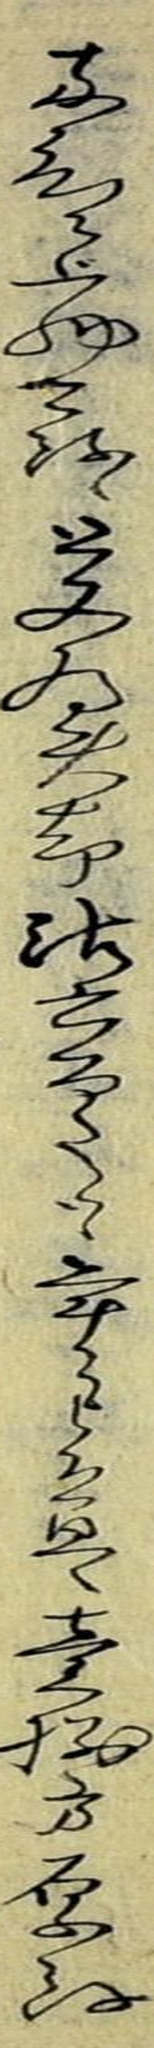両度に上納可致候且又為失却銀六百匁つゝ年々被下置候売捌方厚致
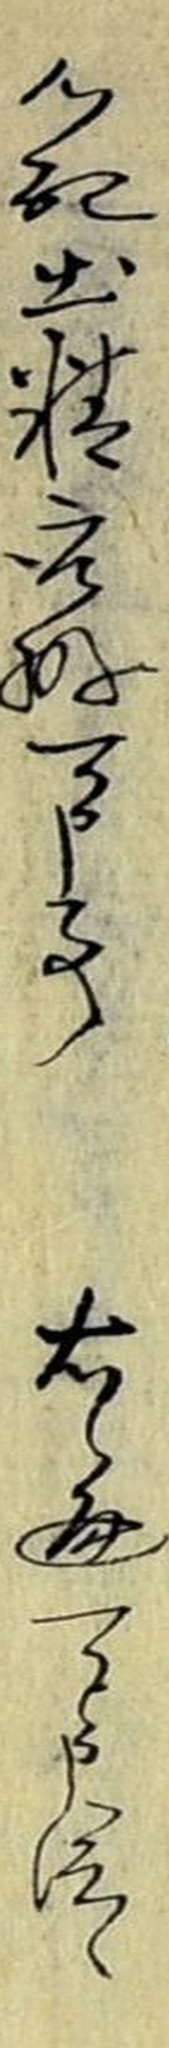心配出精取扱可申事右之通可被申渡候
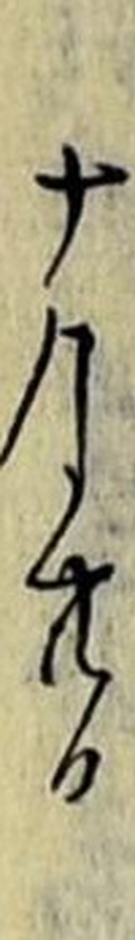十月廿日
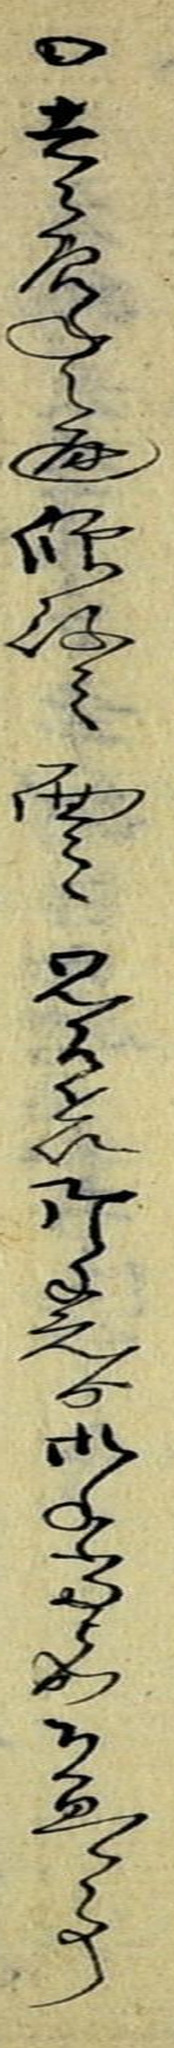○去々辰年之通師役之面々へ思召を以御手元ゟ御手当被成下置候事
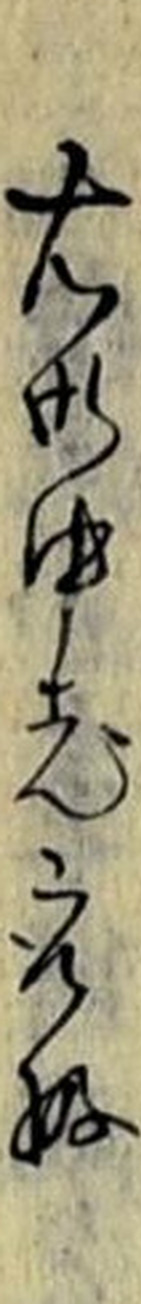右御中老取扱
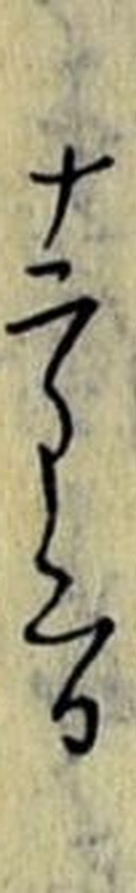十二月二日
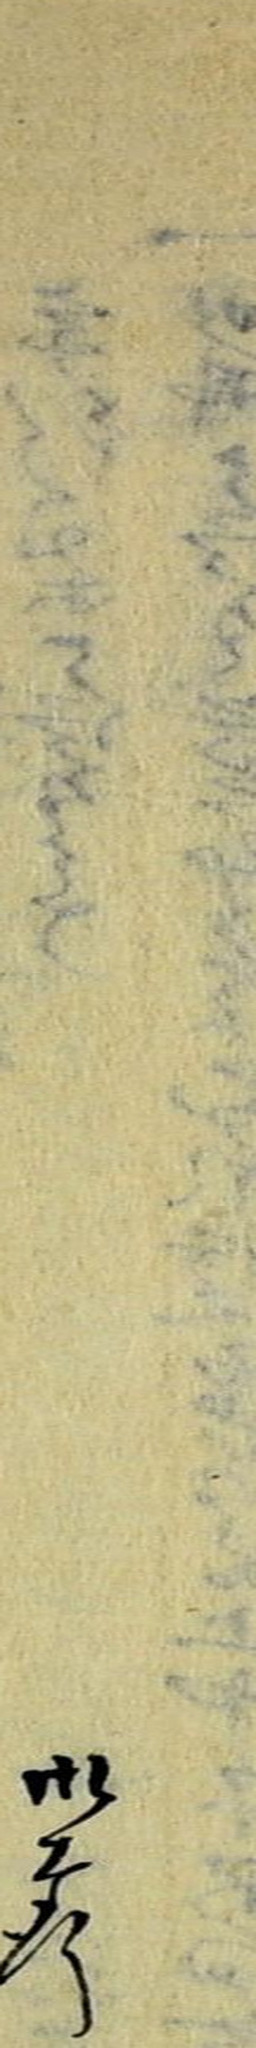御奉行
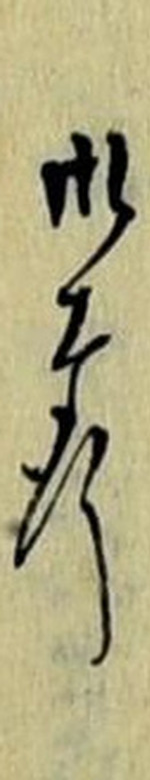御奉行
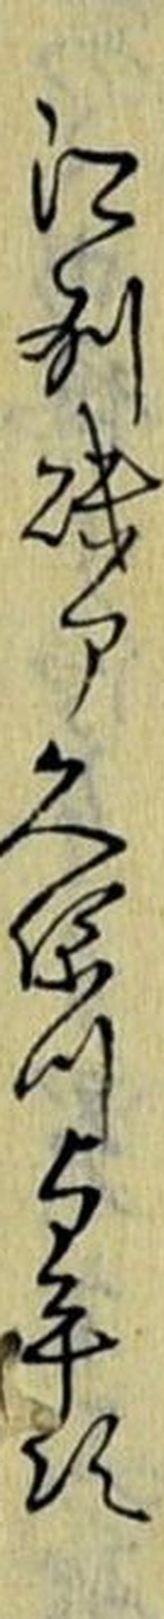江州磯部久保川与平次
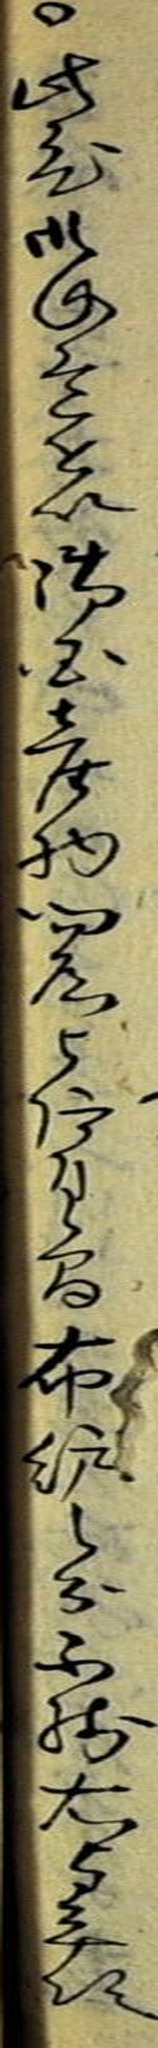○此度御趣意を以御国産問屋被仰付候間布䋆之分不残右与平次
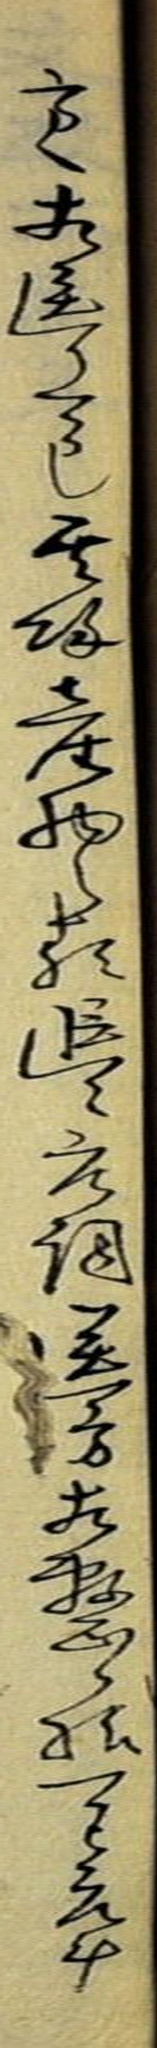方へ相送り可申候其餘産物之類追々取調送方相整候様可被取斗
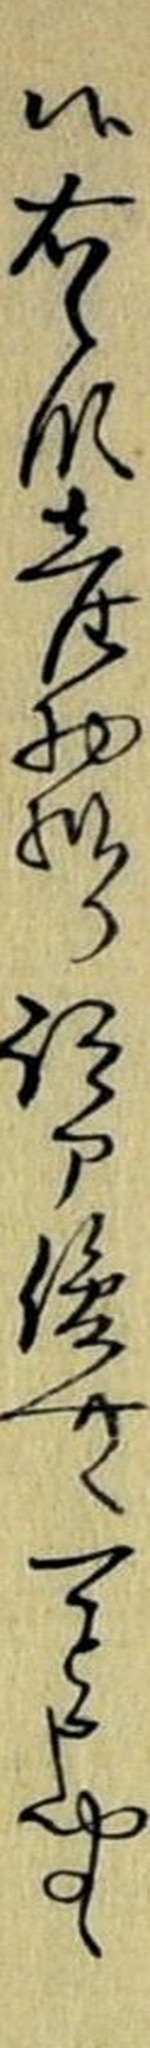候右之段産物掛り跡部俊介へ可被申聞候
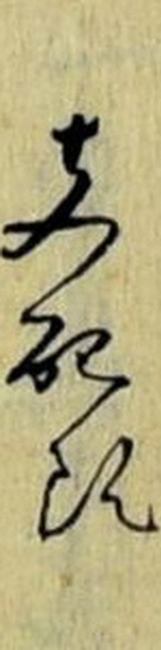支配頭
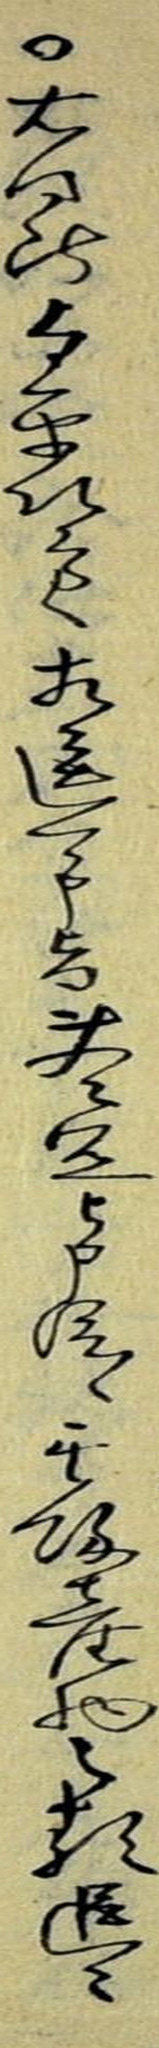○右同断与平次方へ相送可申旨夫々宜被申渡候其餘産物之類追々
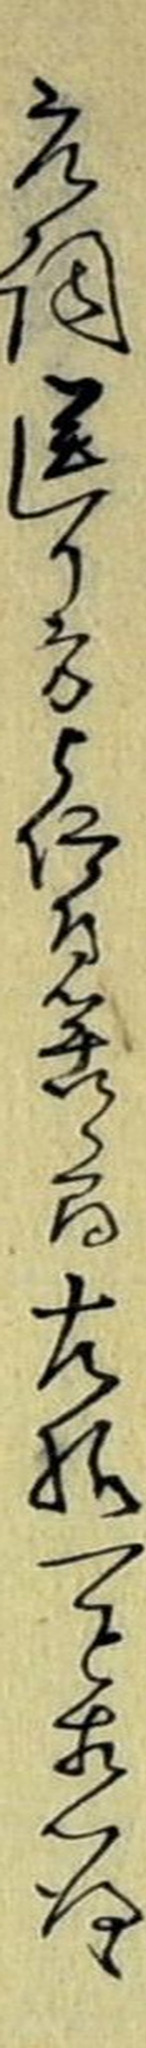取調送り方被仰付筈に候間左様可被相心得候
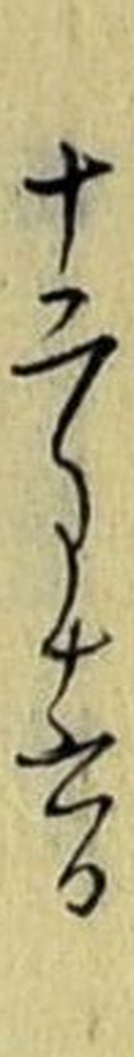十二月十六日
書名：命令之部 四
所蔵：福井県文書館 Fukui Prefectural Archives
